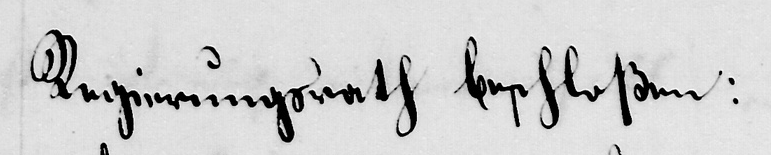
Regierungsrath beschloßen:
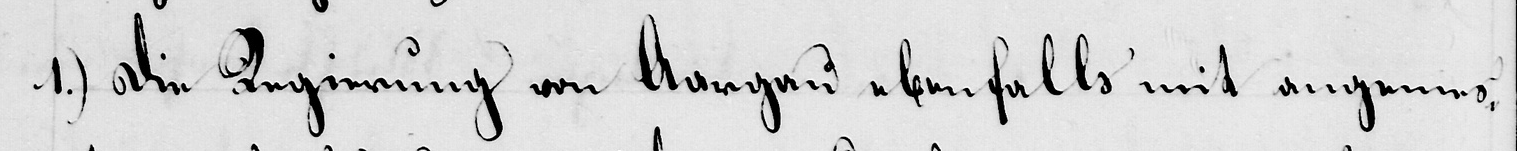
1.) Die Regierung von Aargau ebenfalls mit angemes¬
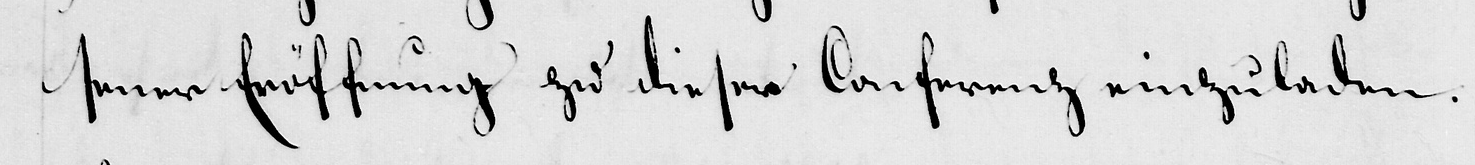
sener Eröffnung zu dieser Conferenz einzuladen.
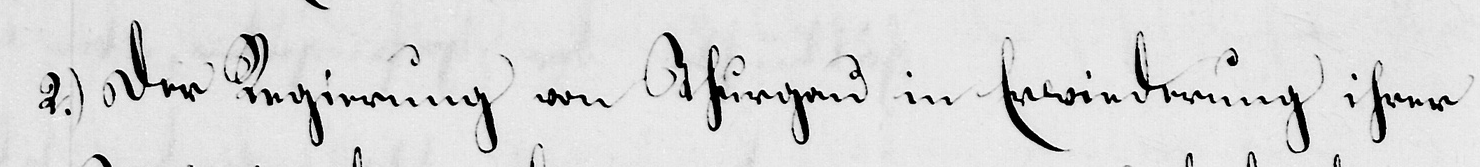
2.) Der Regierung von Thurgau in Erwiederung ihrer
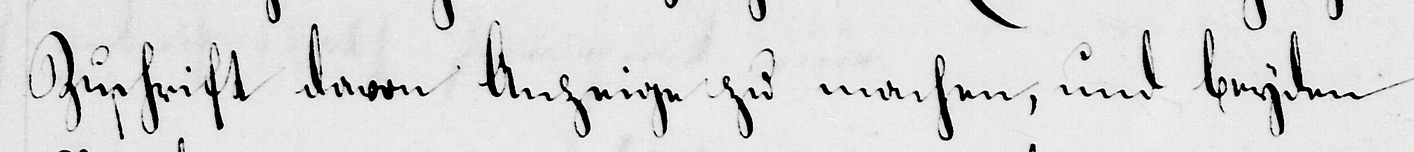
Zuschrift davon Anzeige zu machen, und beyden
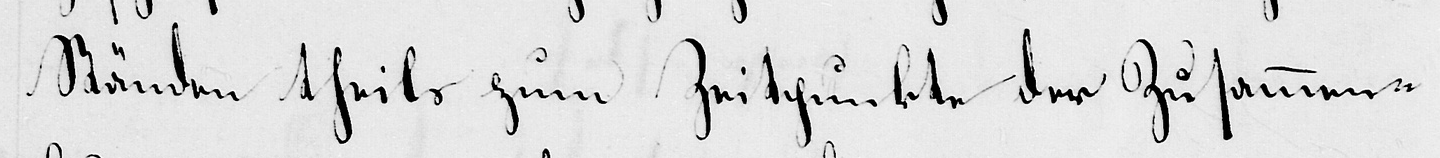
Ständen theils zum Zeitpunkte der Zusammen¬
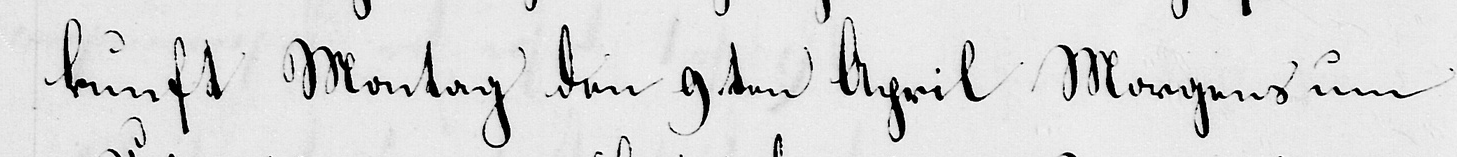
kunft Montag den 9ten April Morgens um
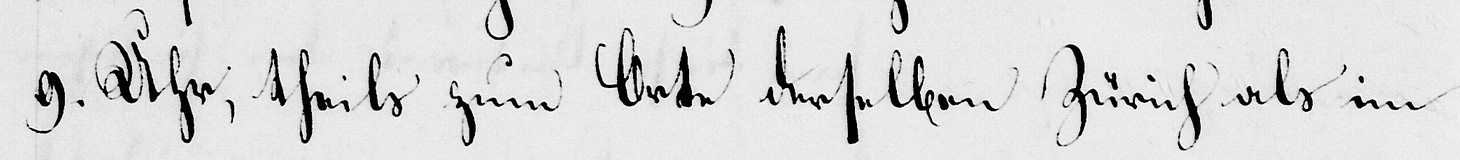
9. Uhr, theils zum Orte derselben Zürich als im
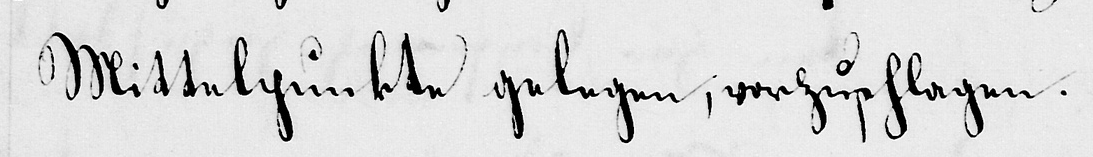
Mittelpunkte gelegen, vorzuschlagen.
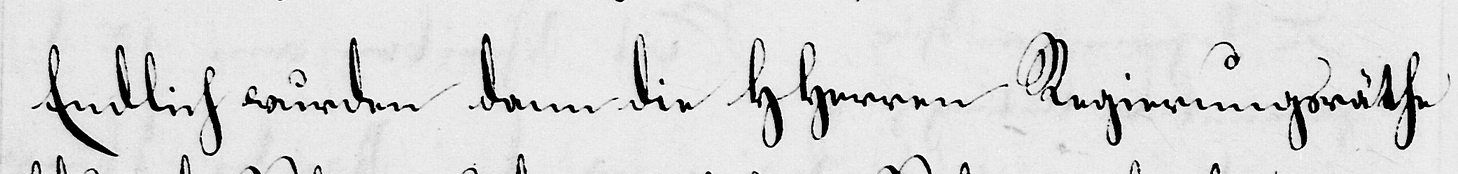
Endlich wurden dann die HHerren Regierungsräthe
